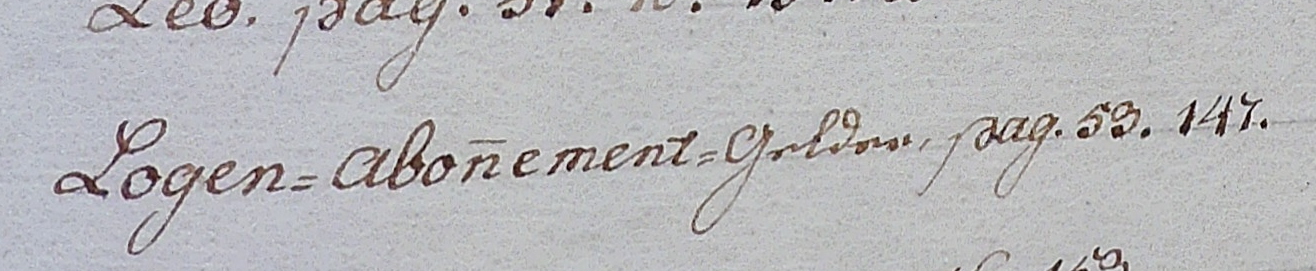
Logen=Abon̅ement=Gelder, pag. 53. 147.
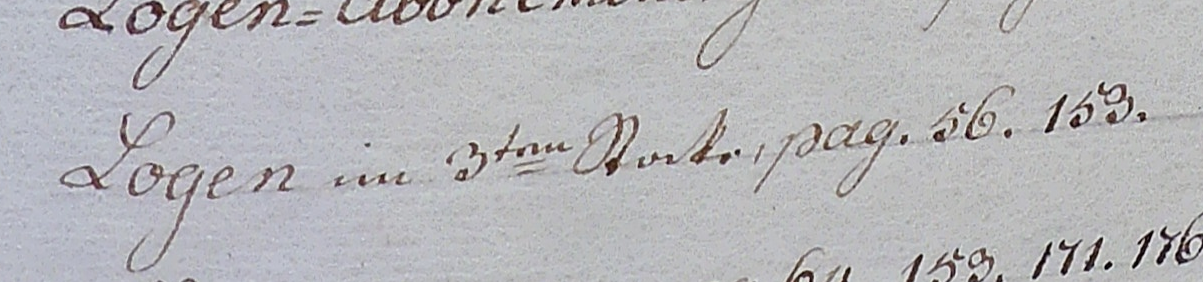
Logen im 3te͇n Stocke, pag. 56. 153.
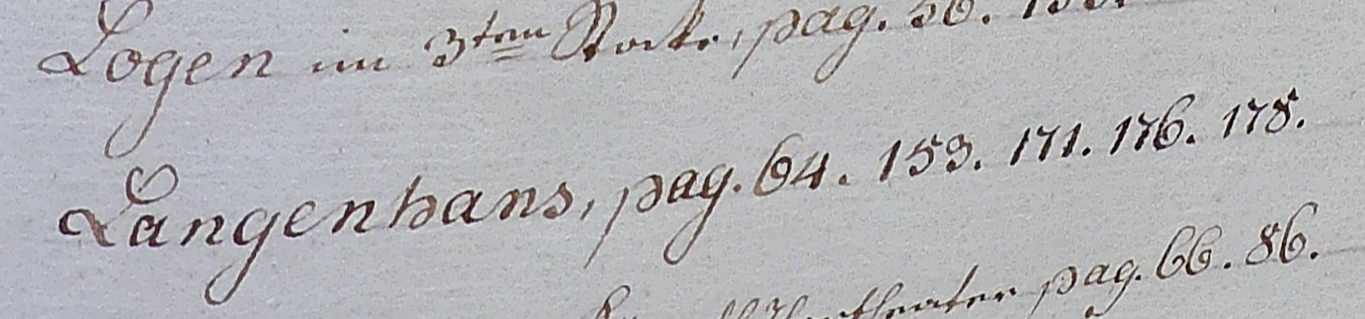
Langenhans, pag. 64. 153. 171. 176. 178.
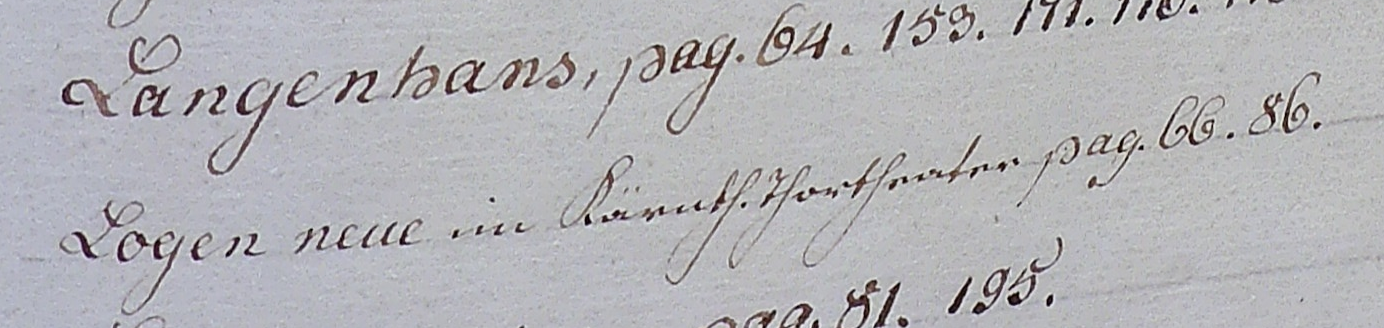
Logen neue im Kärnth.Thortheater pag. 66. 86.
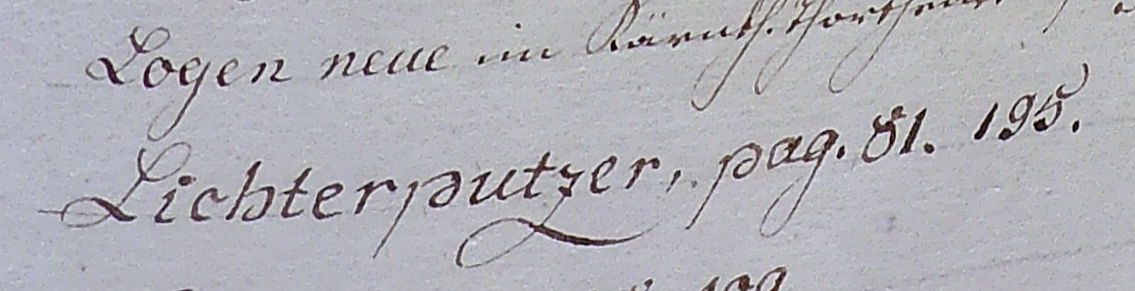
Lichterputzer, pag. 81. 195.
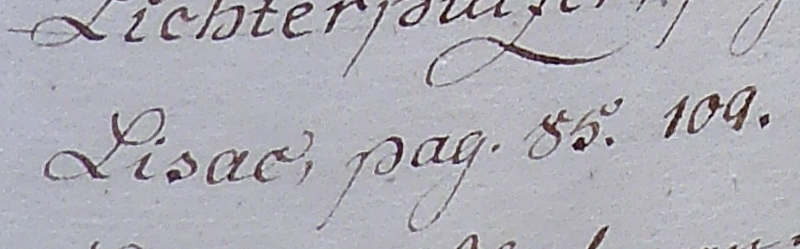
Lisac, pag. 85. 109.
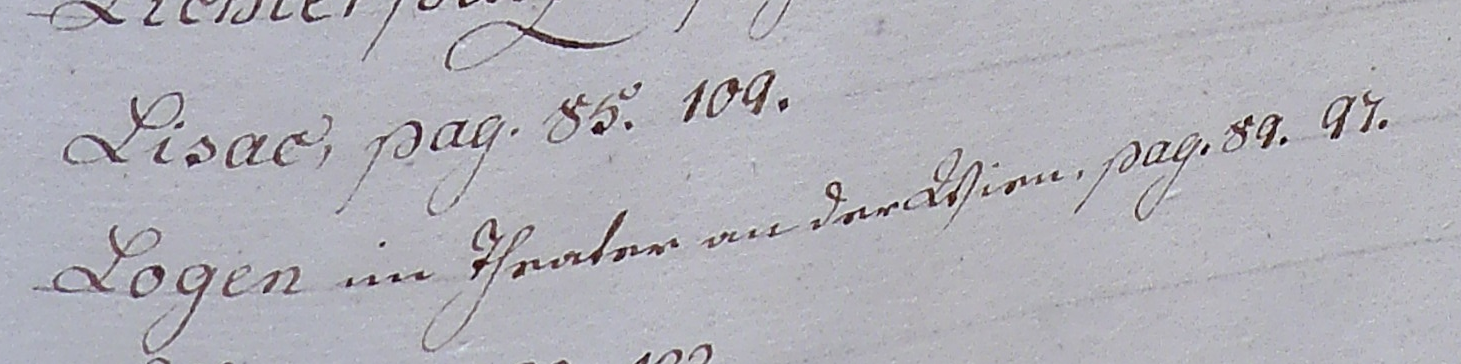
Logen im Theater an der Wien, pag. 89. 97.
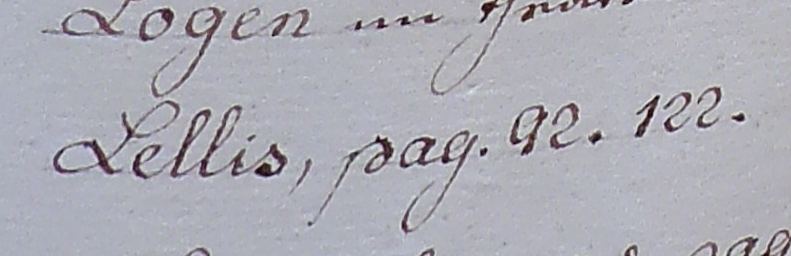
Lellis, pag. 92. 122.
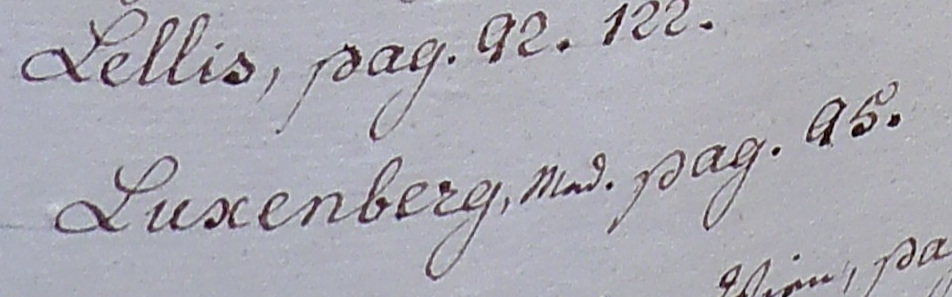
Luxenberg, Mad. pag. 95.
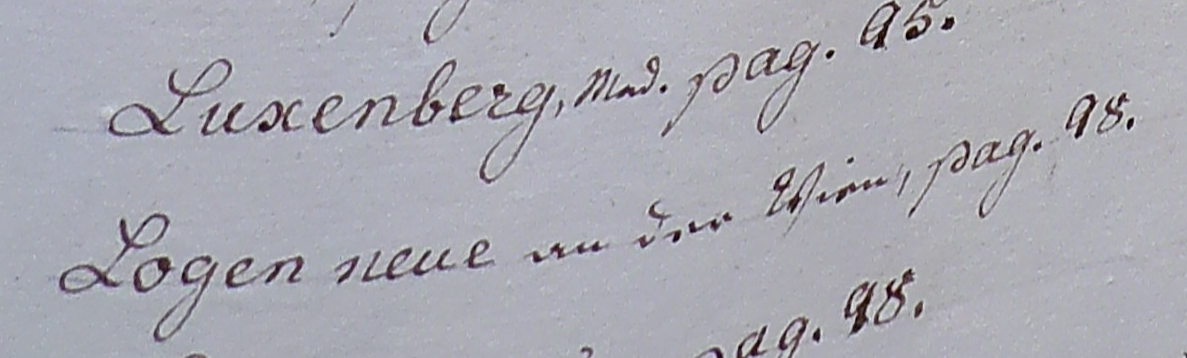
Logen neue an der Wien, pag. 98.
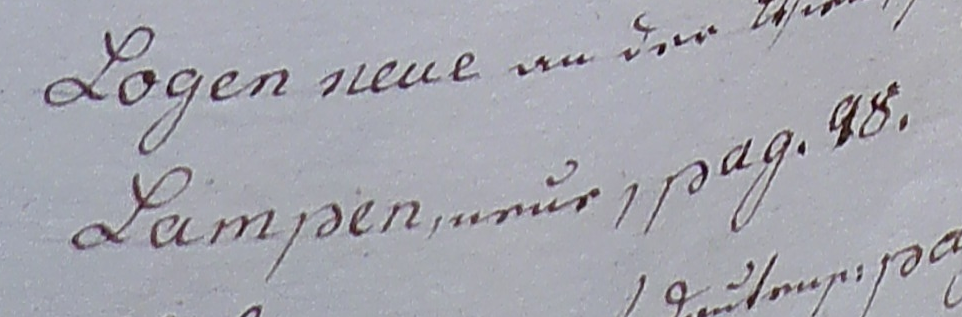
Lampen, neue, pag. 98.
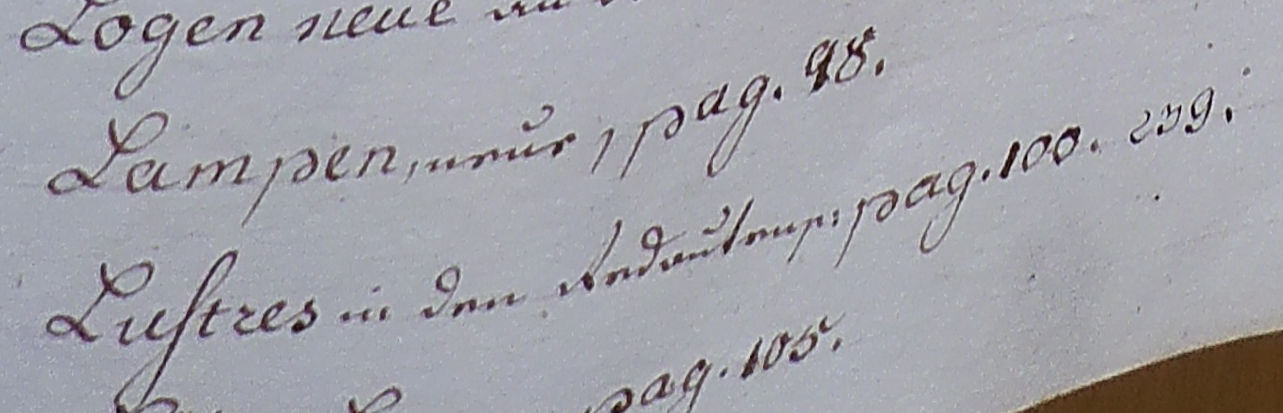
Lustres in den Redoutens: pag. 100. 239.
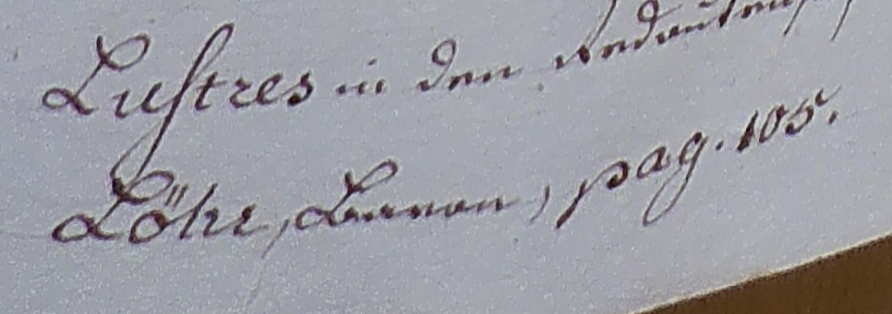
Löhr, Baron, pag. 105.
